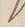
748
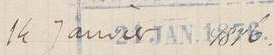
14 Janvier 1876.
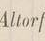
Monsieur
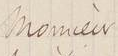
Direction
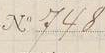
de fer du
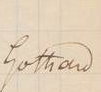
Gothard
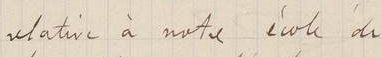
relative à notre école de
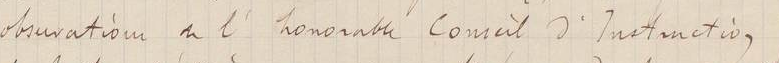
observations de l'honorable Conseil d'Instruction
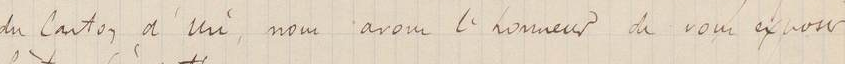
du Canton d'Uri, nous avons l'honneur de vous exposer les
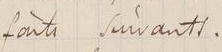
faits suivants.
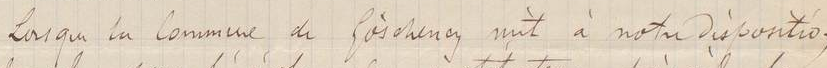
Lorsque la Commune de Göschenen mit à notre disposition
